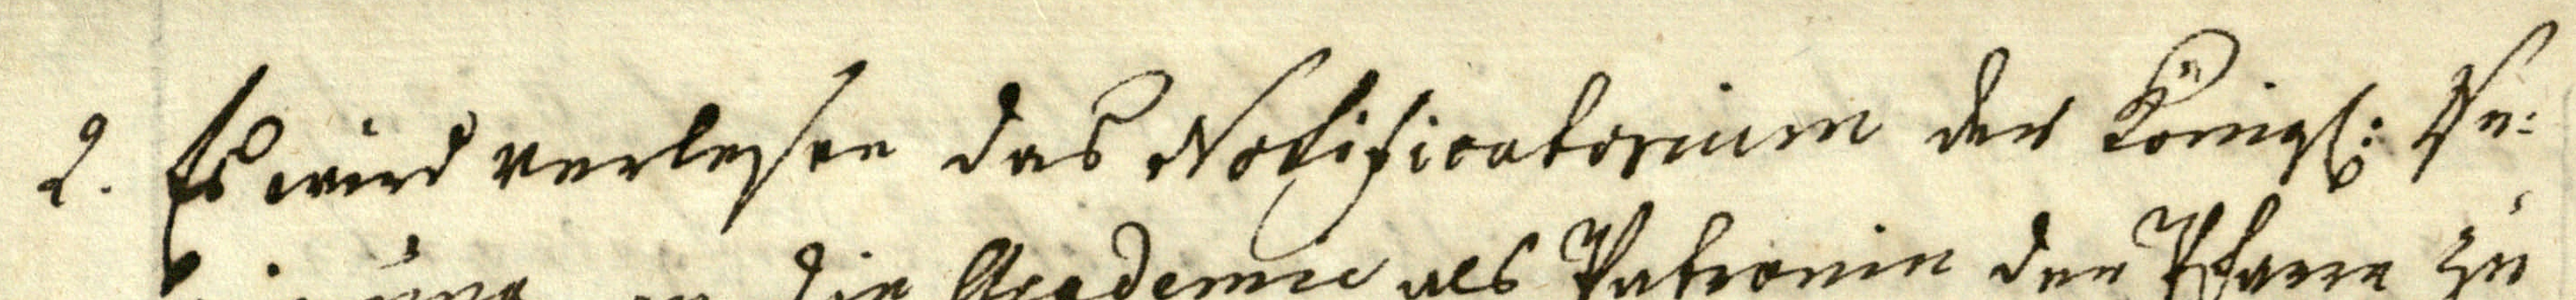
2. Es wird verlesen das Notificatorium der Königl. Re¬
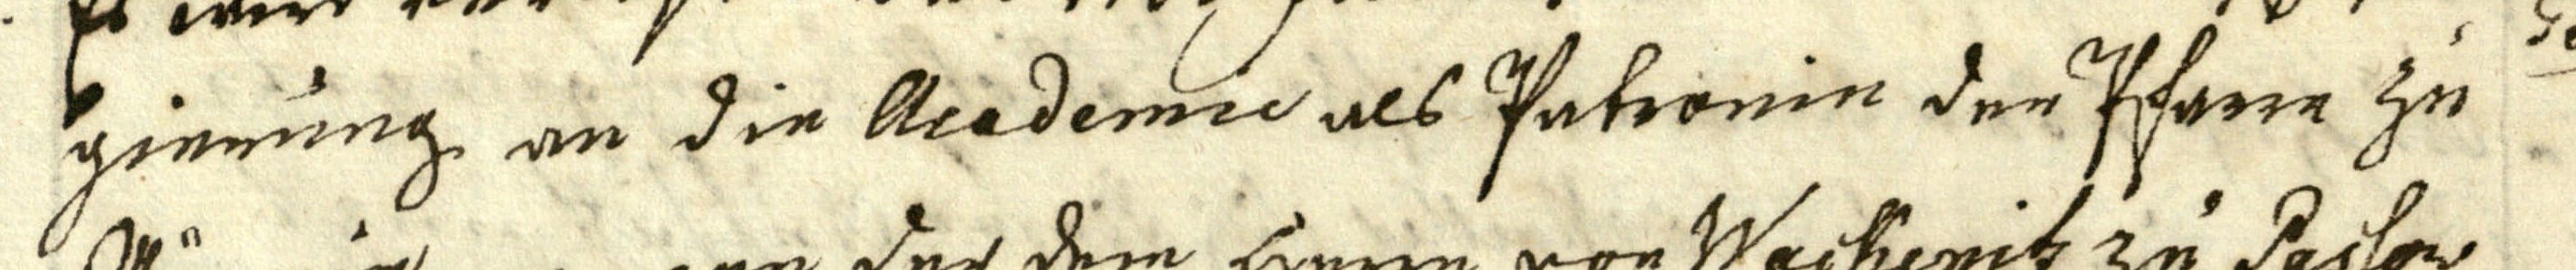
gierung an die Academie als Patronin der Pfarre zu
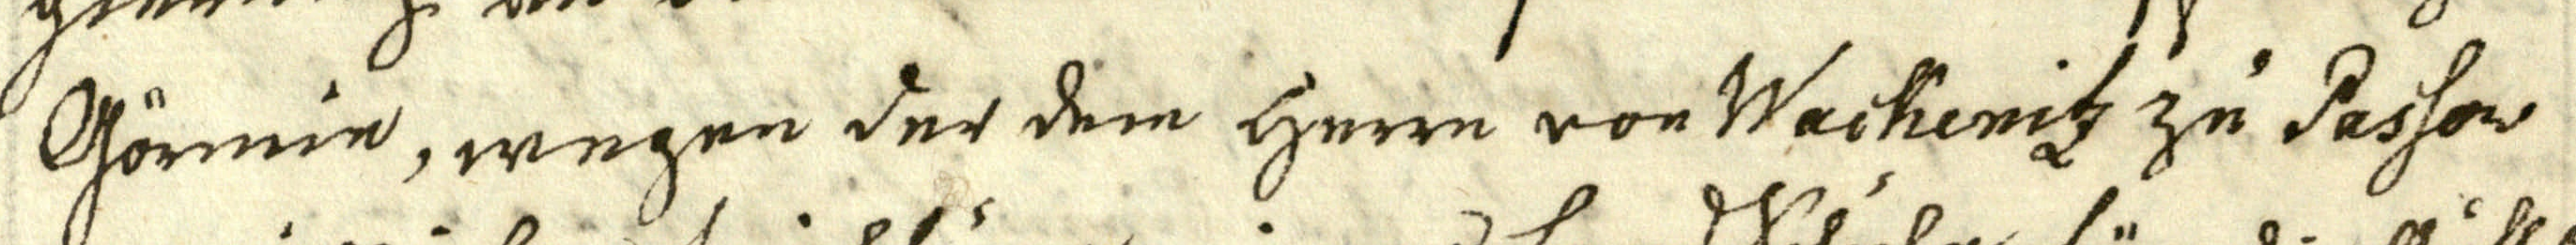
Görmin, wegen der dem Herrn von Wackenitz zu Passow
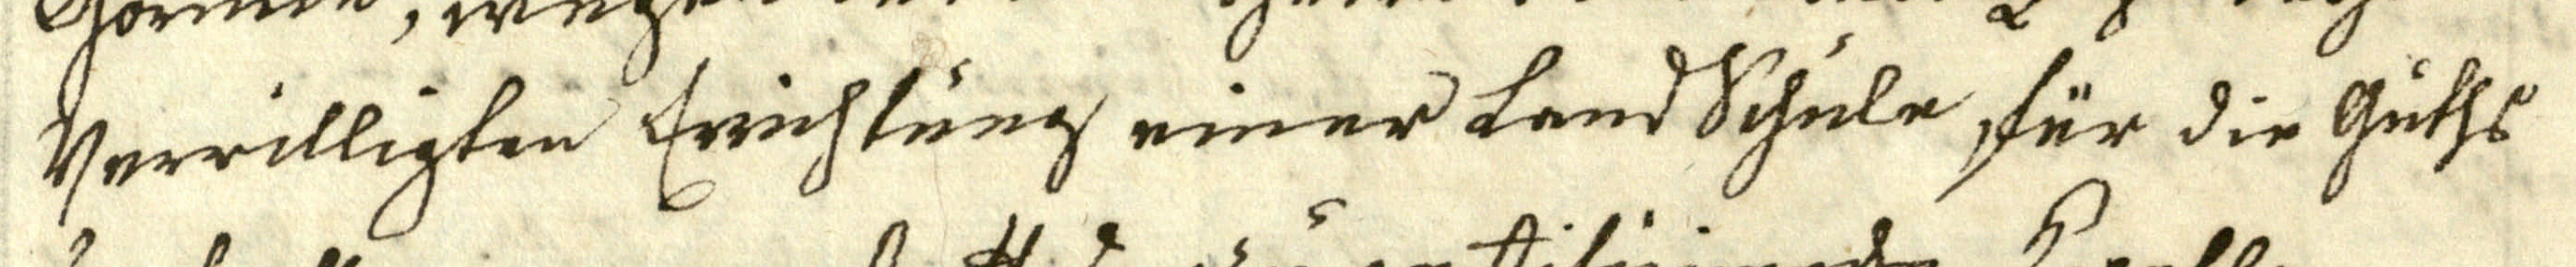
verwilligten Errichtung einer LandSchule für die Guths
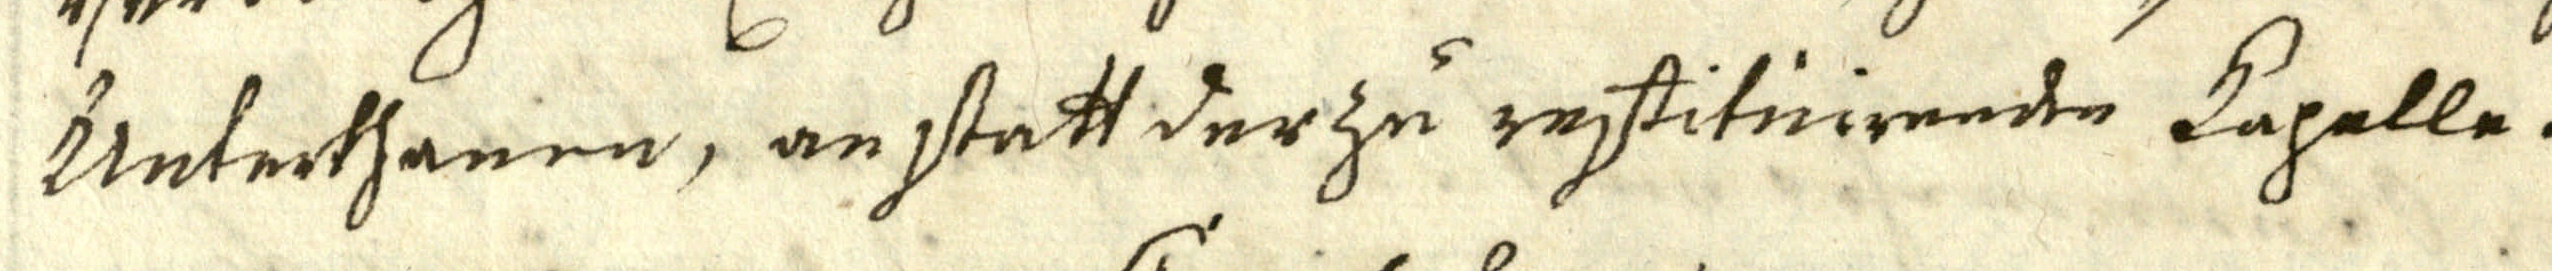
Unterthanen, an statt der zu restituirenden Kapelle.
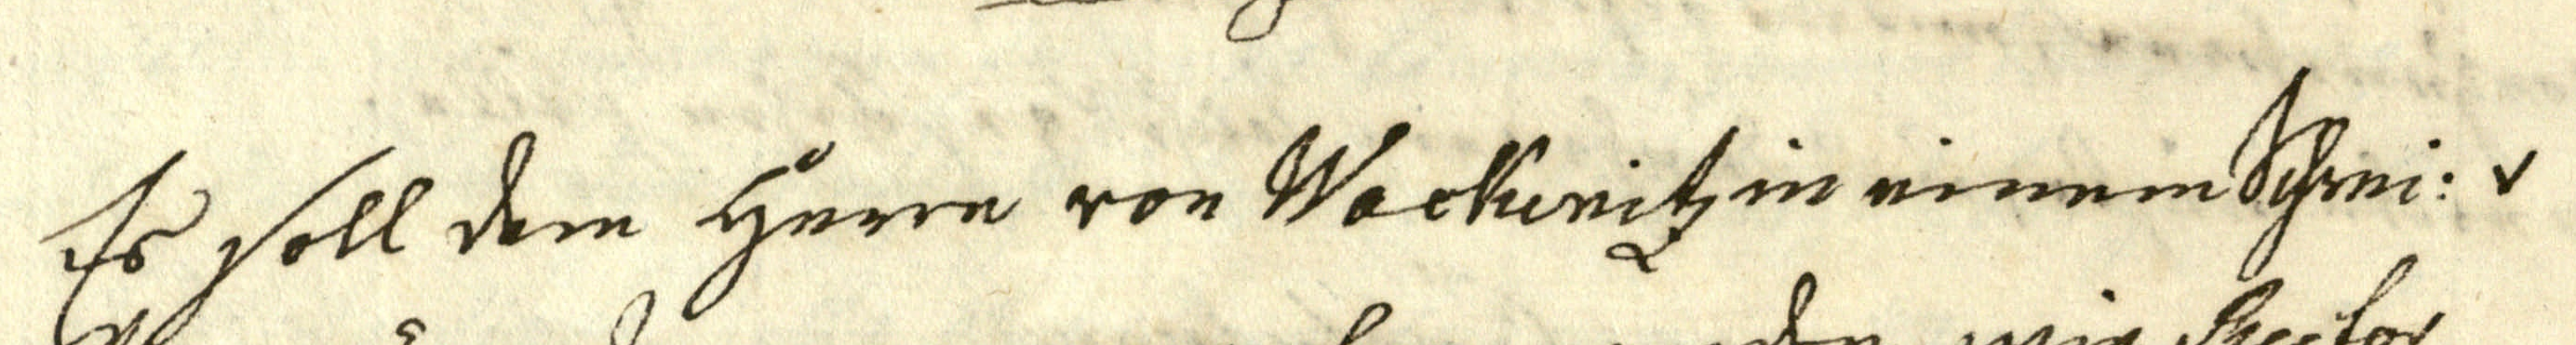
Es soll dem Herrn von Wackenitz in einem Schei¬
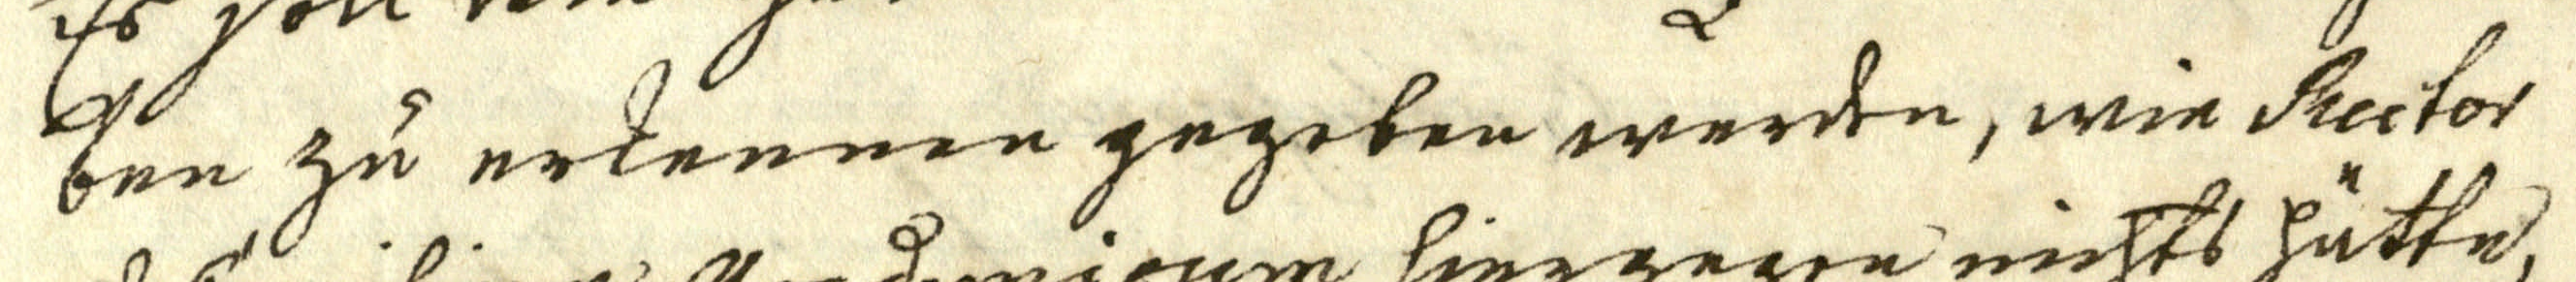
ben zu erkennen gegeben werden, wie Rector
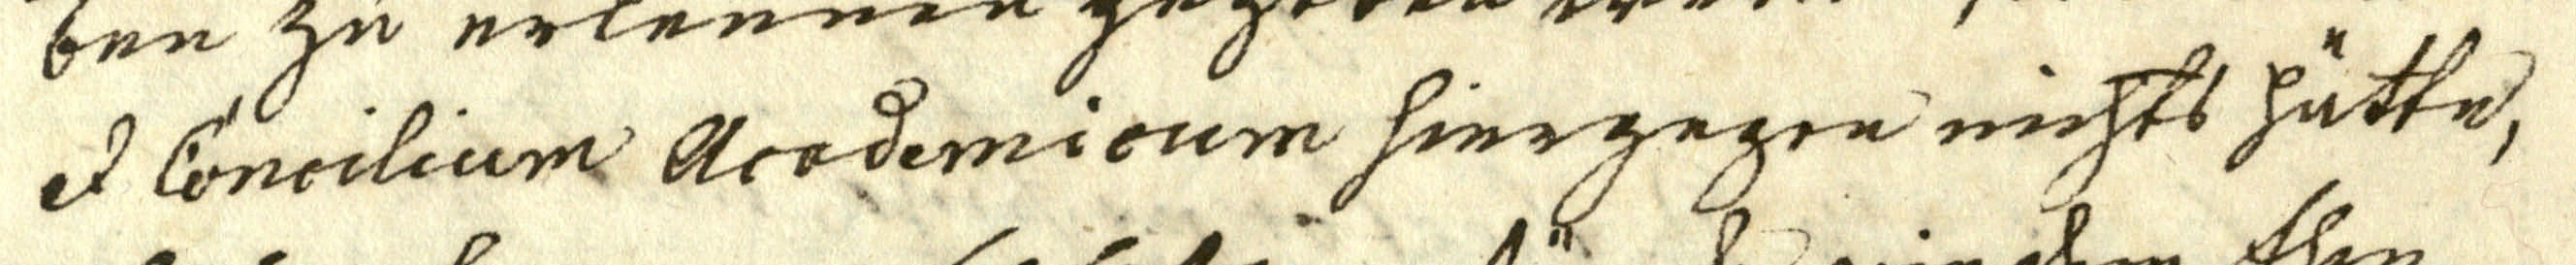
et Concilium Academicum hiergegen nichts hätte,
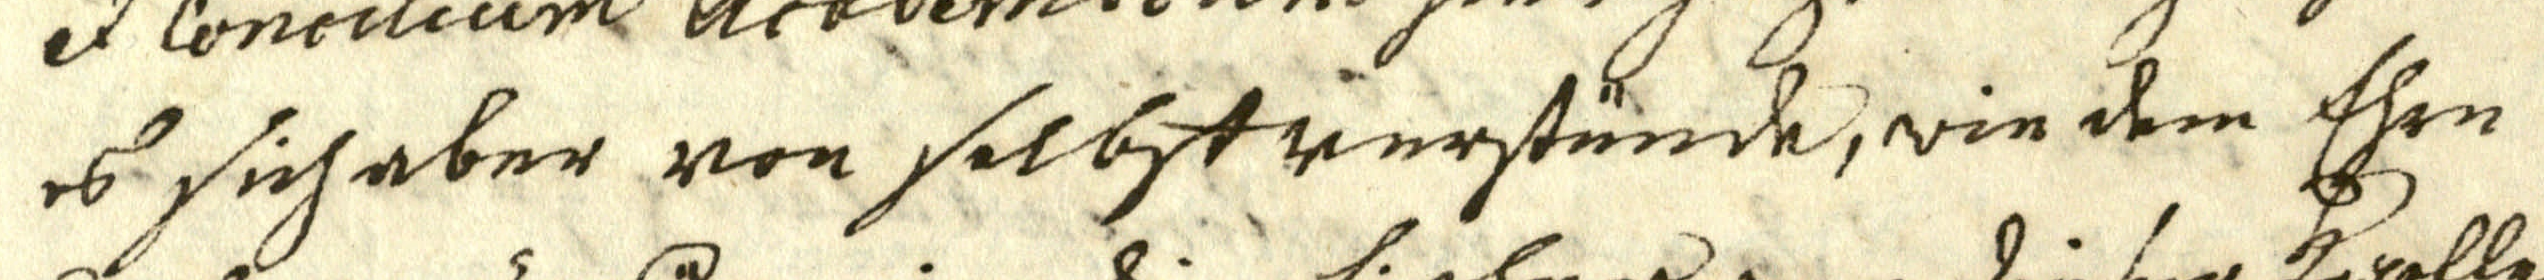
es sich aber von selbst verstünde, wie dem Ehrn
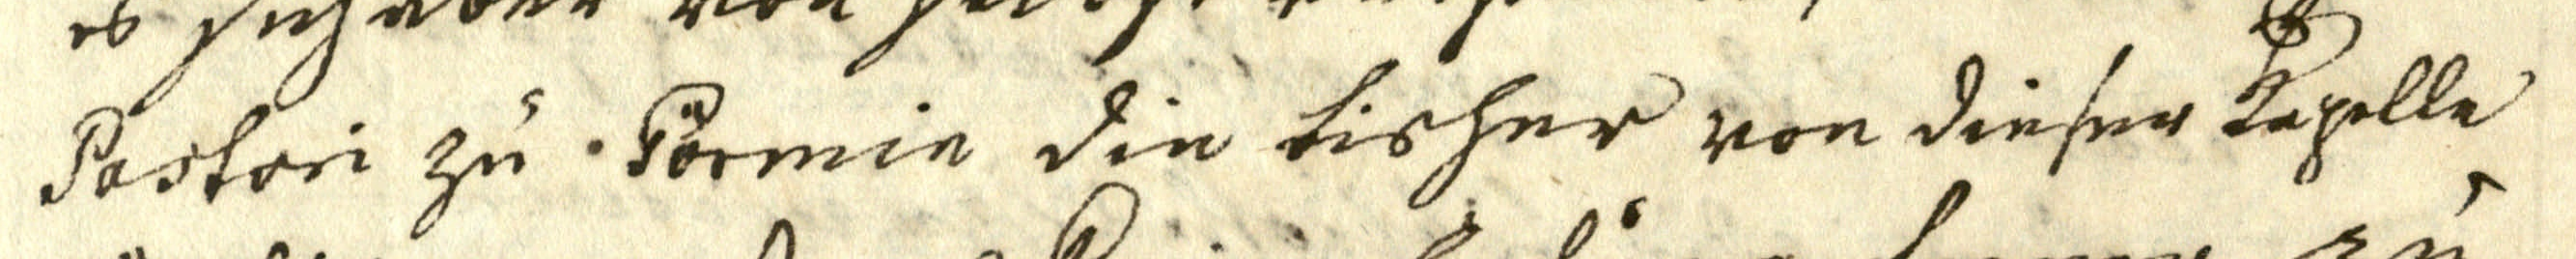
Pastori zu Görmin die bisher von dieser Kapelle
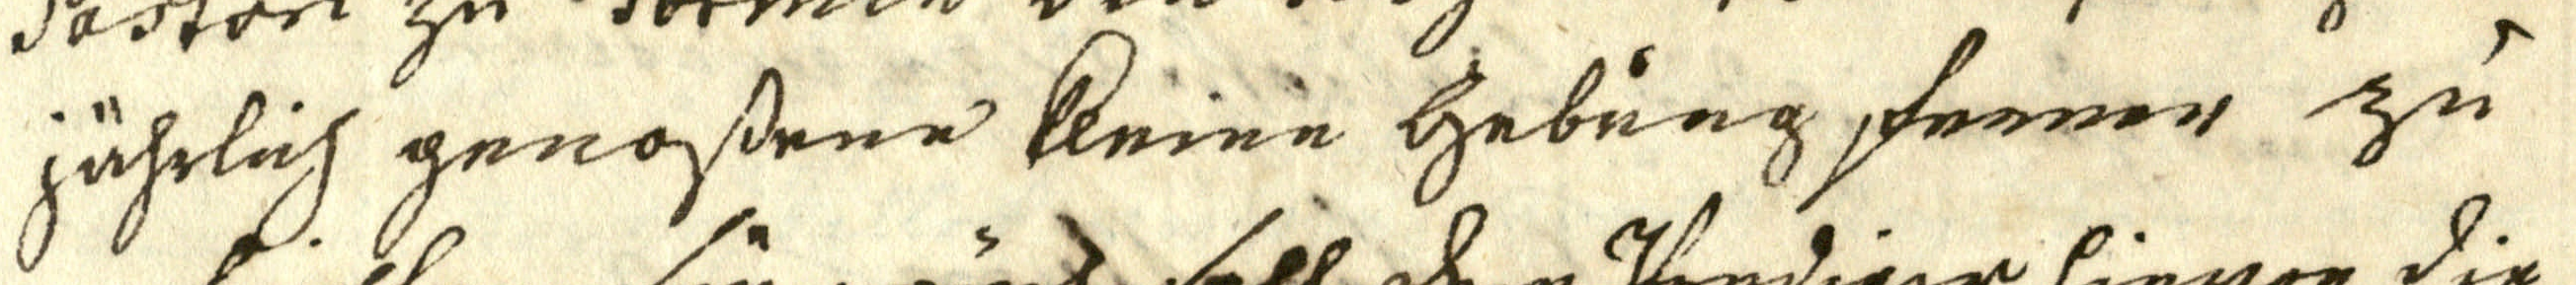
jährlich genoßene kleine Hebung ferner zu
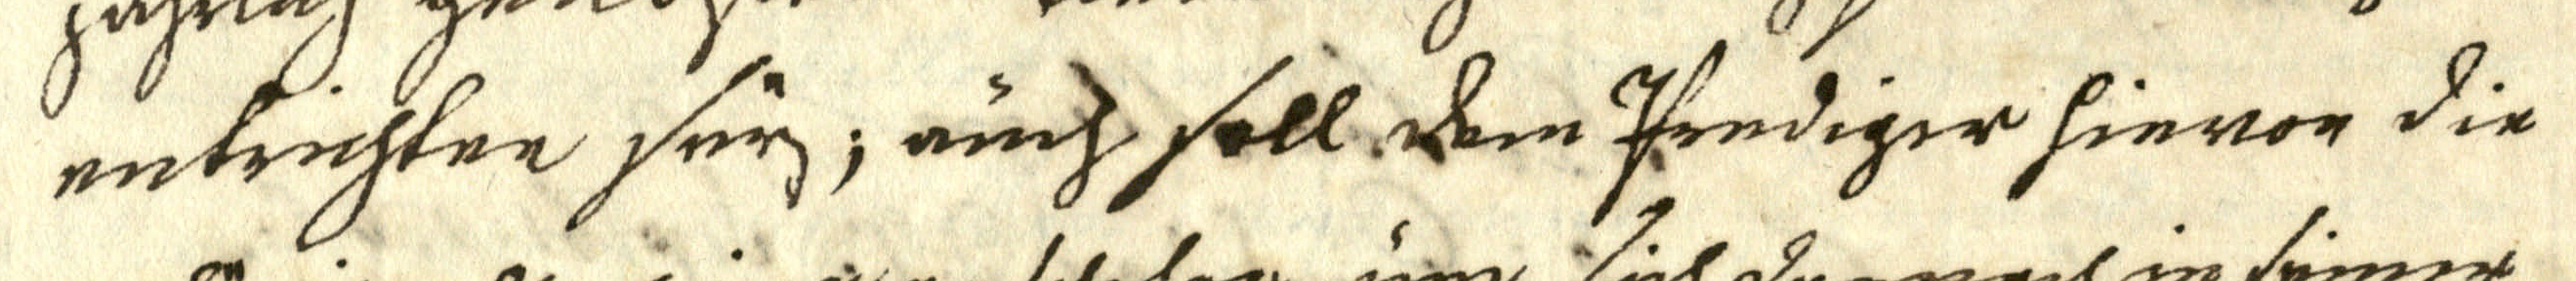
entrichten seÿ, auch soll dem Prediger hievon die
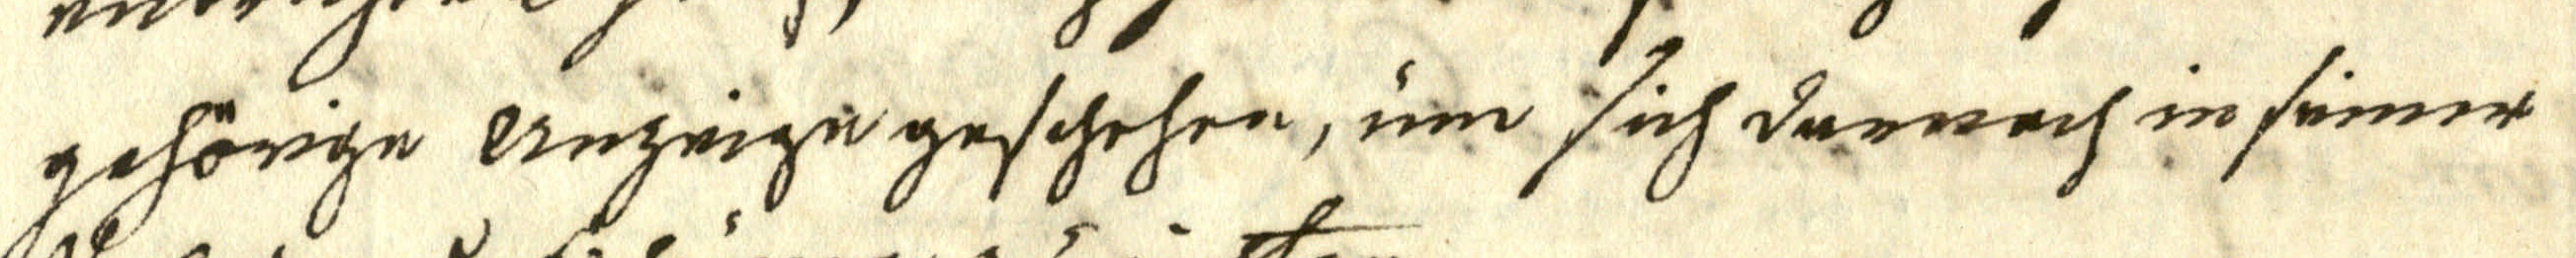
gehörige Anzeige geschehen, um sich darnach in seiner
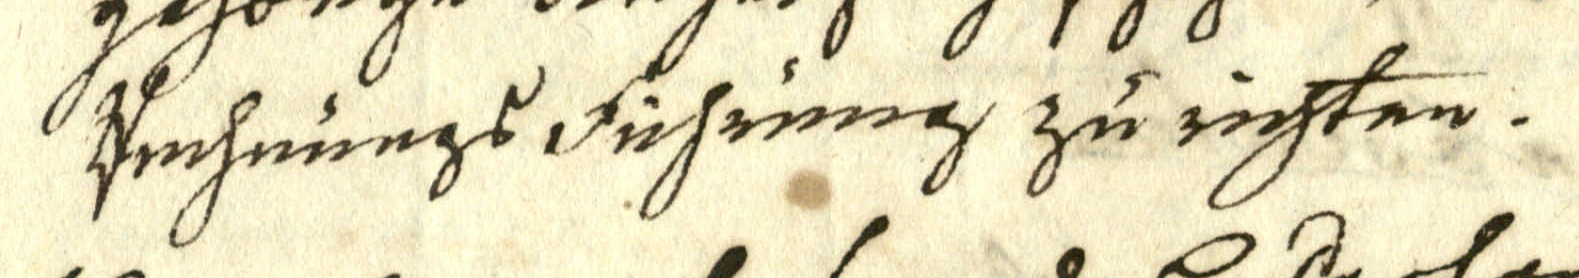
Rechnungs Führung zu richten.
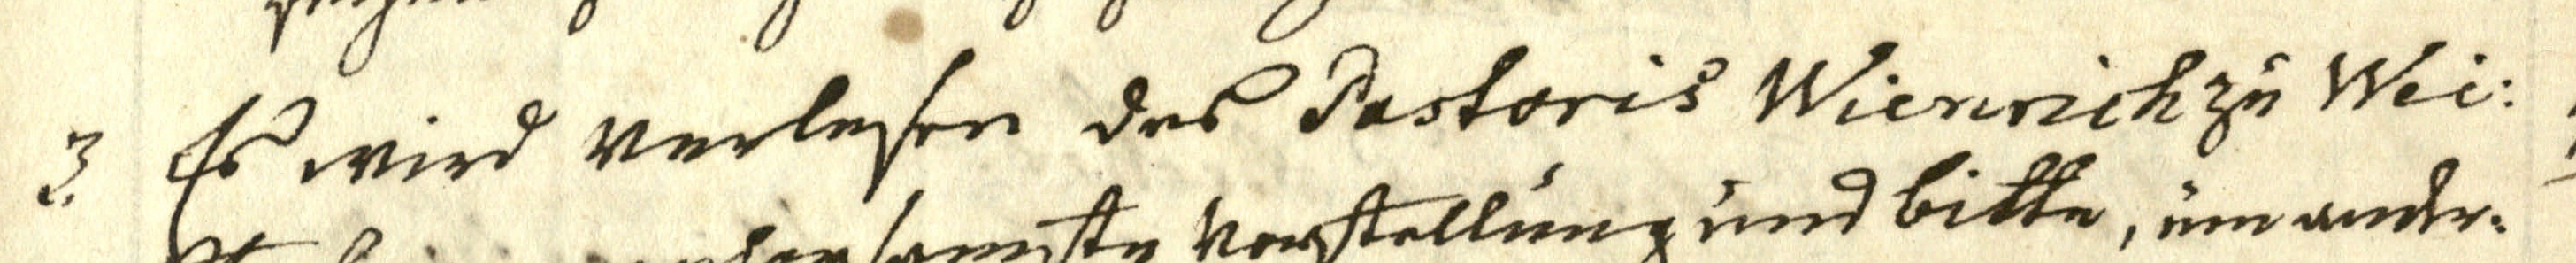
3. Es wird verlesen des Rectoris Wienrich zu Wei¬
